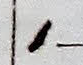1
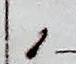1
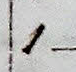1
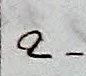2
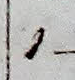1
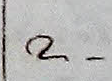2
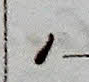1
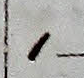1
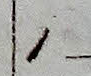1
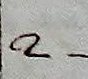2
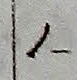1
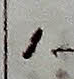1
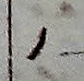1
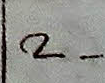2
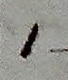1
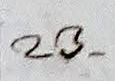23
